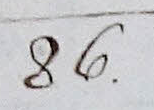86.
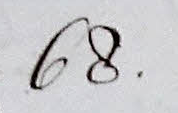68.
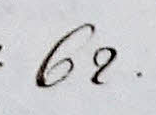62
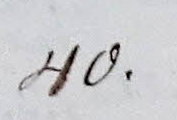40.
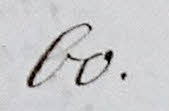60.
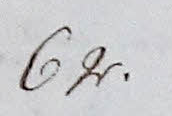62.
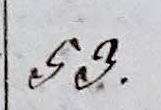53.
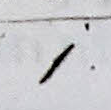1
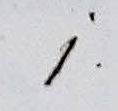1
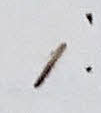1
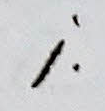1
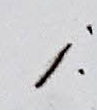1
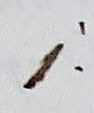1
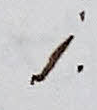1
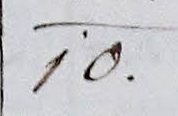10.
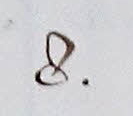8.
